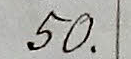50.
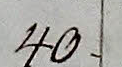40
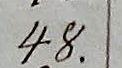48.
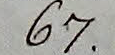67
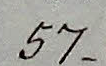57
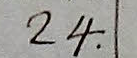24.
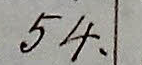54.
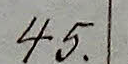45.
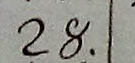28.
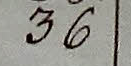36
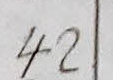42
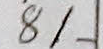81
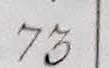73
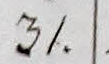31.
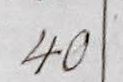40
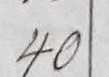40
